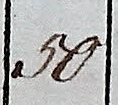50
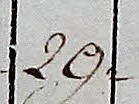29
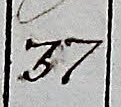37
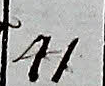41
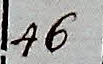46
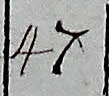47
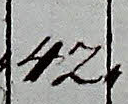42
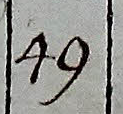49
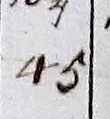45
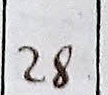28
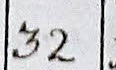32
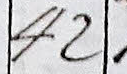42
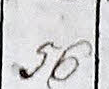56
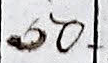50
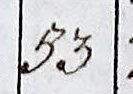53
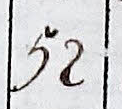52
